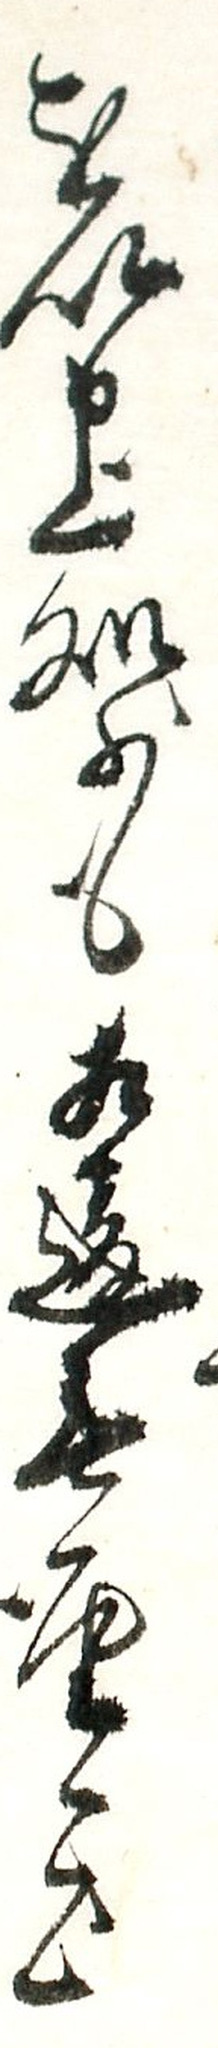を以申上処少も相違無御坐候以上
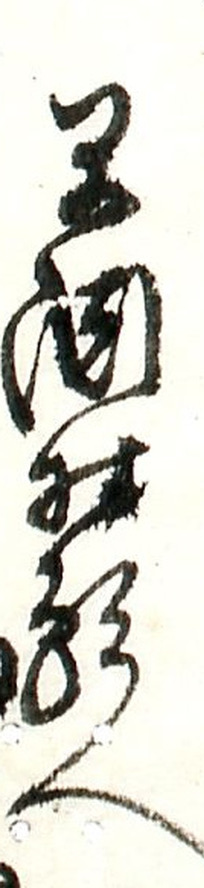早渕村願人
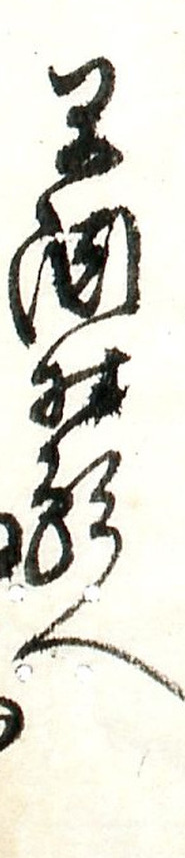早渕村願人
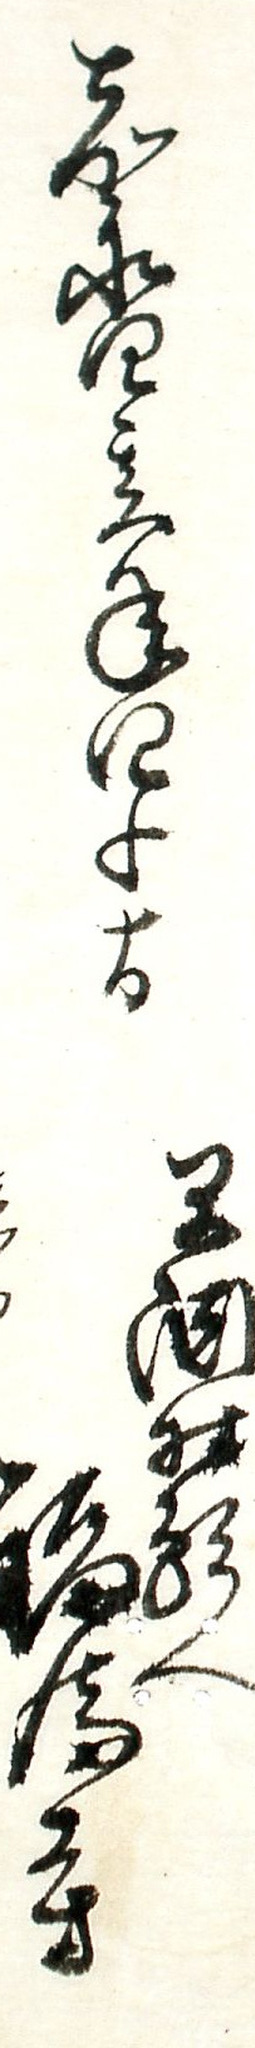嘉永四亥年四月十日福満寺
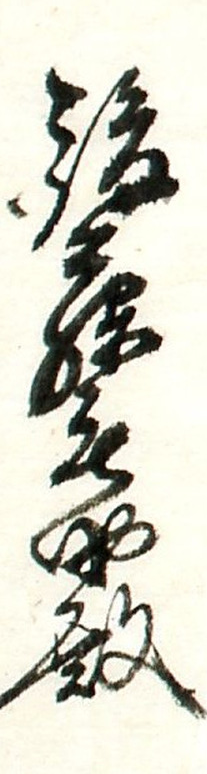後藤庄助殿
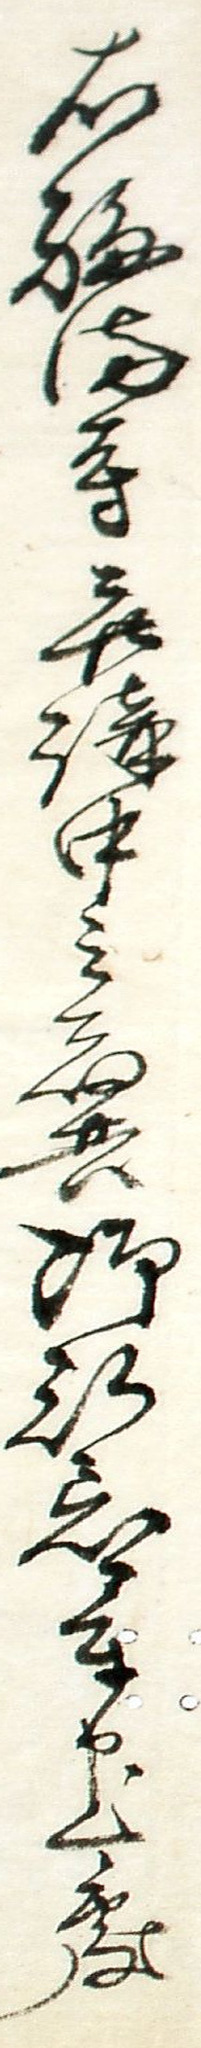右福満寺幷講中之者共御行着ニ付申上候處
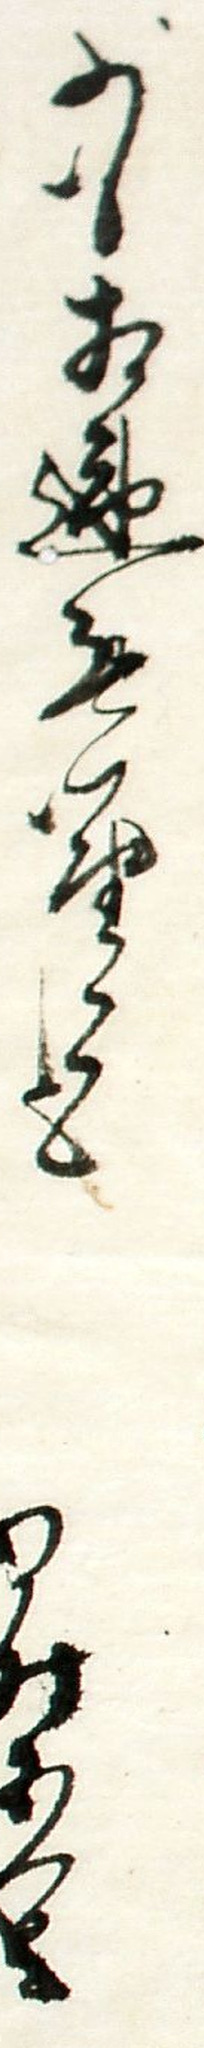少も相違無御坐候以上同村五人与
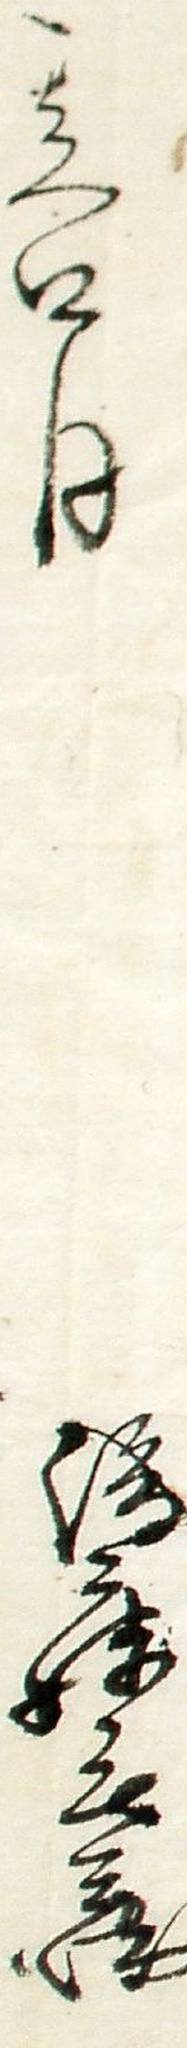亥四月後藤庄兵衛
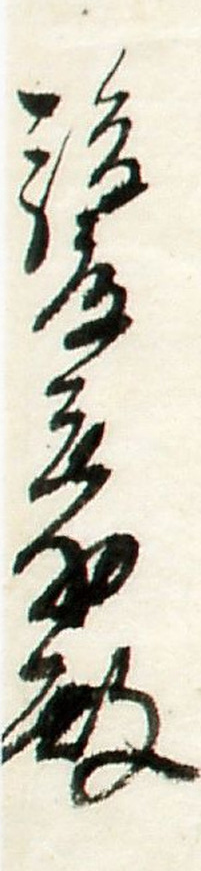後藤庄助殿

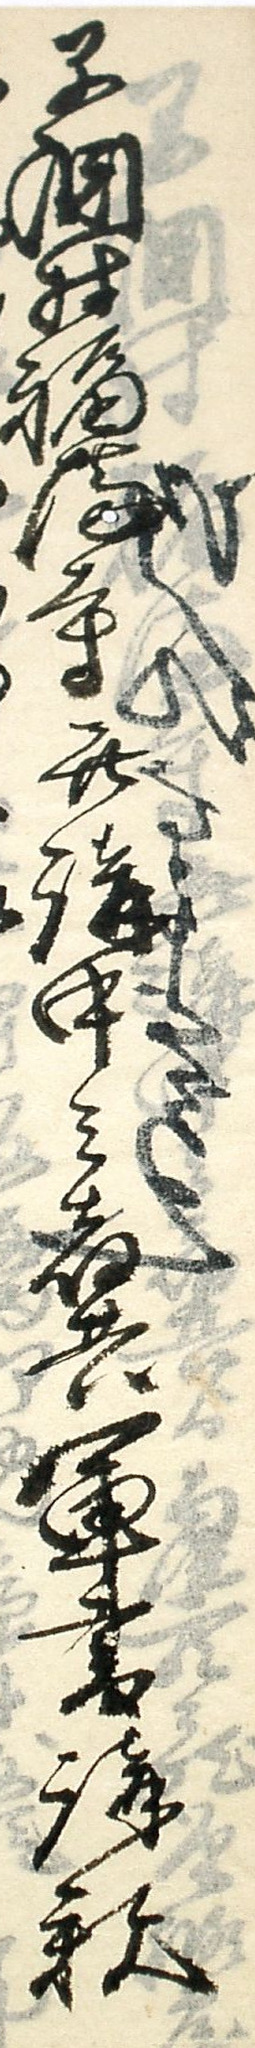早渕村福満寺幷講中之者共軍書講釈
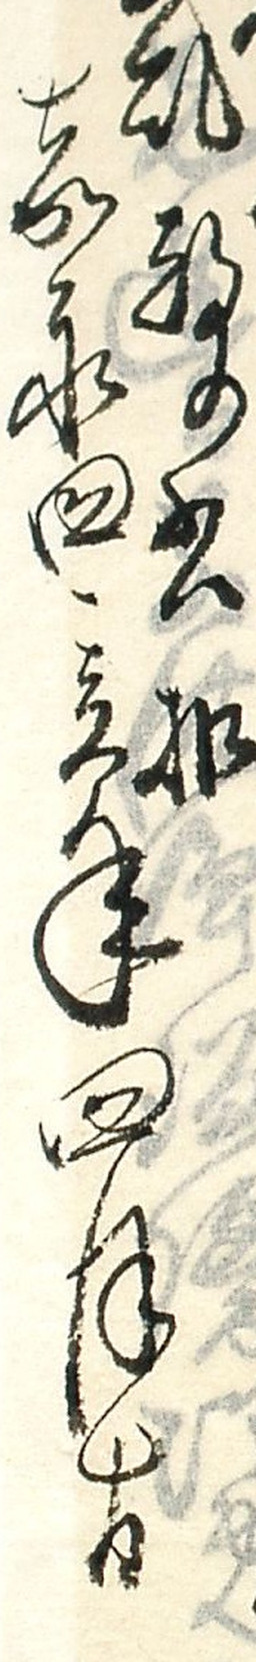嘉永四亥年四月十日

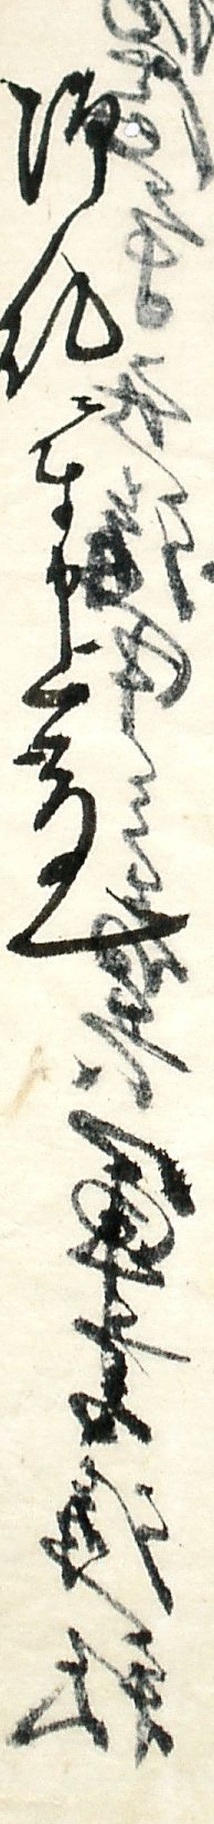御糺ニ付申上覚
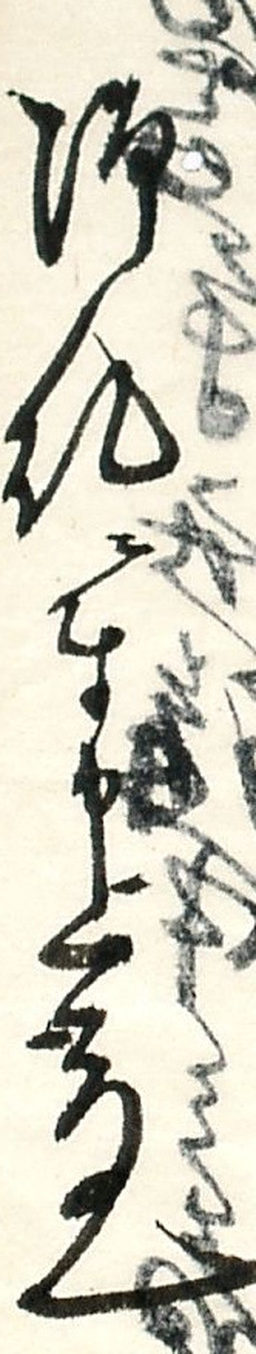御糺ニ付申上覚
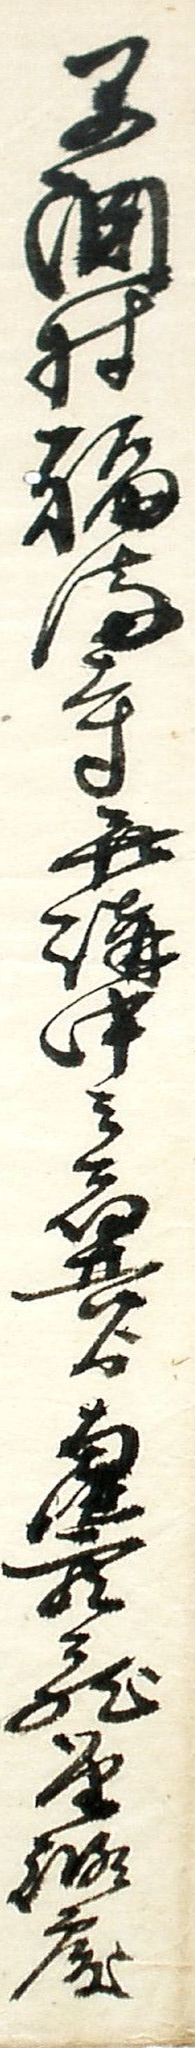早渕村福満寺幷講中之者共ゟ虚空蔵堂修覆
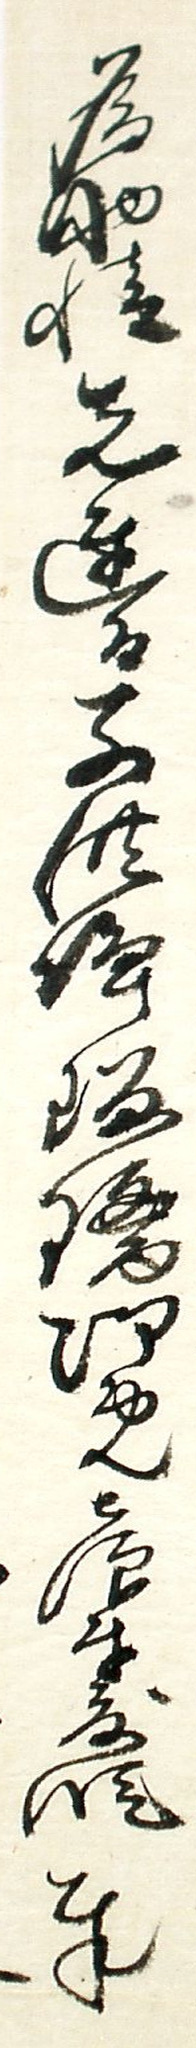為助情先達而子供浄瑠璃御免被仰付度段奉

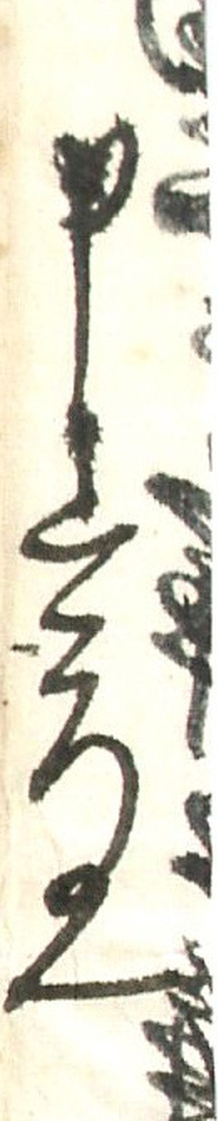申上覚
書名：(早渕村福満寺子ども浄瑠璃願紙面）他
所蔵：鳴門教育大学 Naruto University of Education
